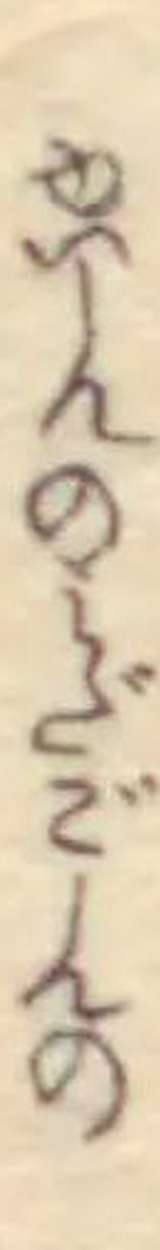ゆいしんのみだごしんの
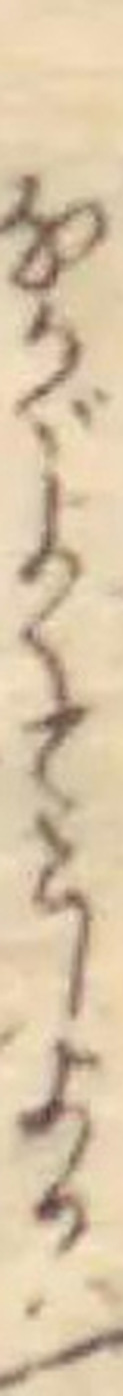なかゞよくてとしより
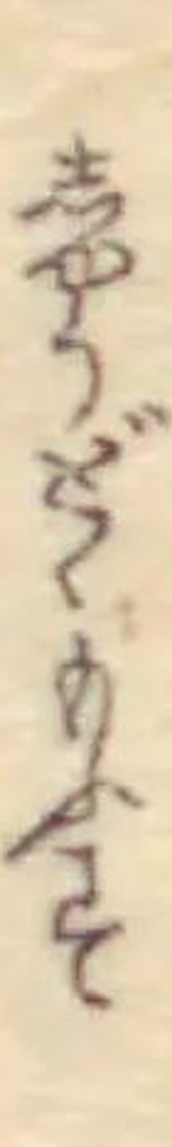しやうどゝもふす
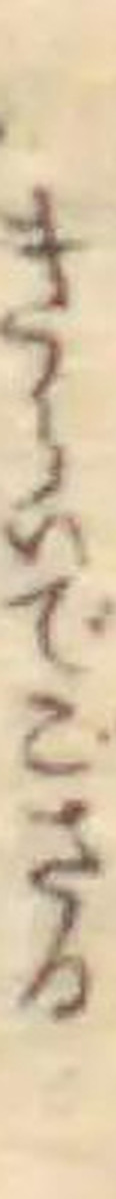きらいでごさる
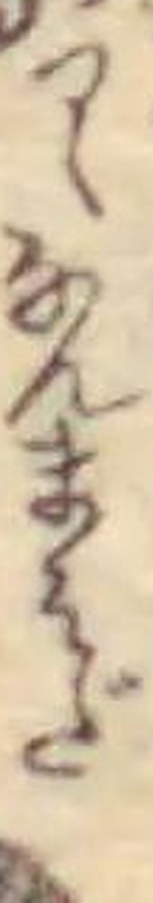アヽなんまみだ
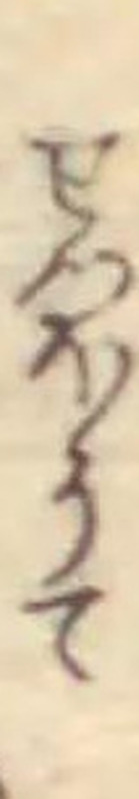せつほうて
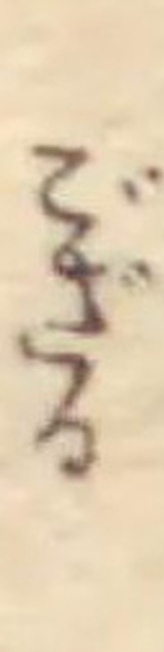ござる
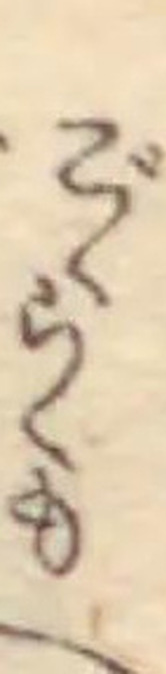ごくらくも
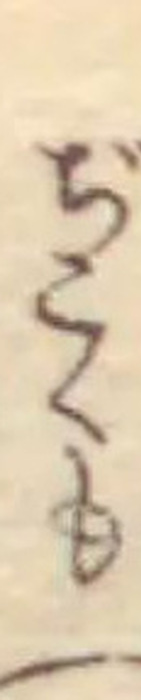ぢごくも
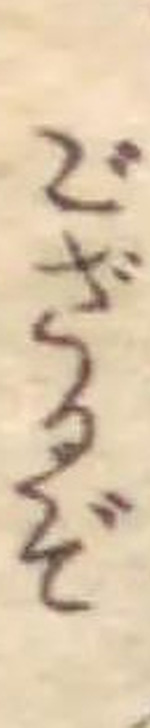ござるぞ

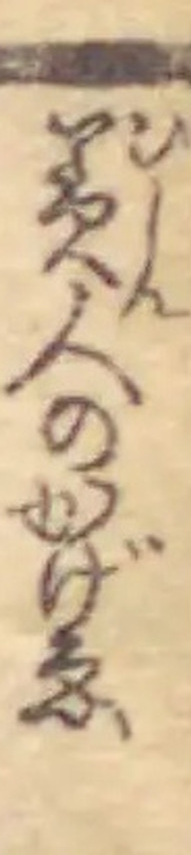美人のかげゑ
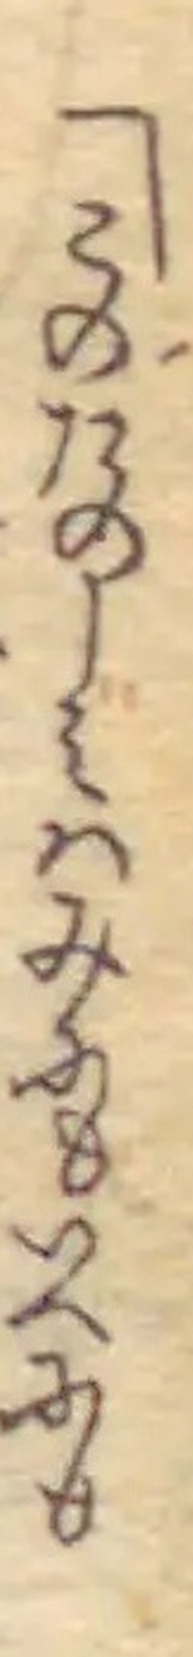このたのしみはみにもいへにも
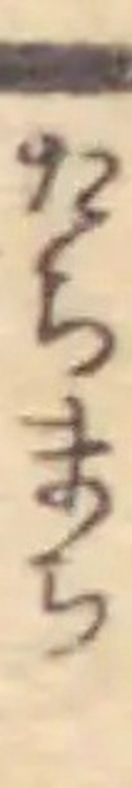たちまち
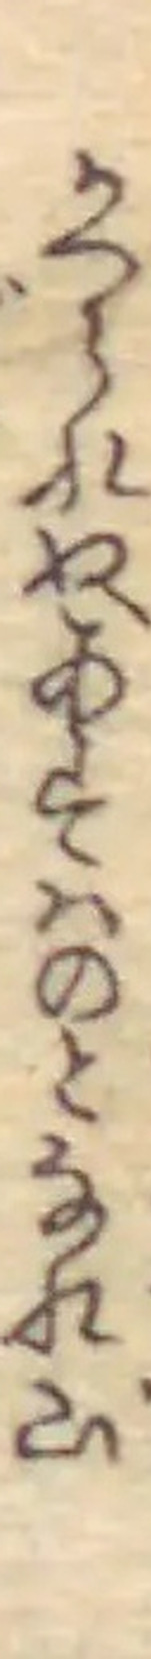かへられぬあすはのとなれ山
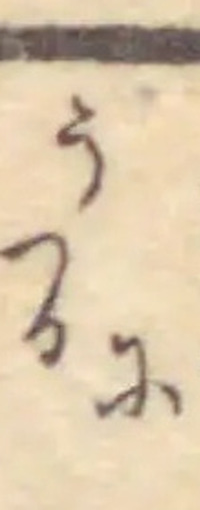うつる
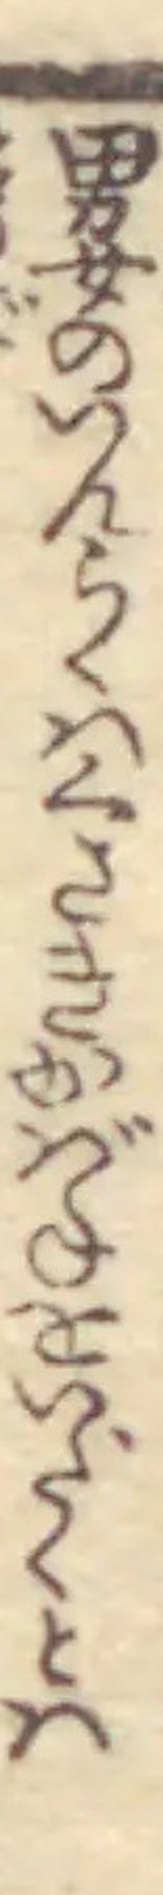男女のいんらくはくさきかばねをいだくとは
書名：児訓影絵喩 3巻
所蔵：国立国会図書館 National Diet Library, JAPAN
